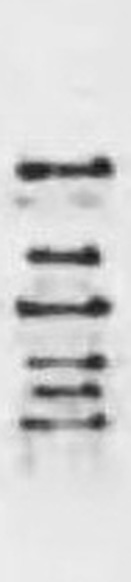一二三

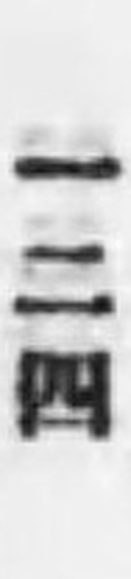一二四
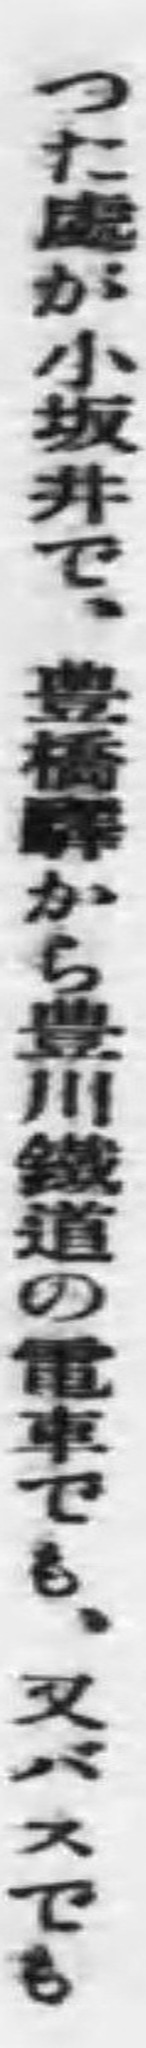つた処が小坂井で、豊橋駅から豊川鉄道の電車でも、又バスでも
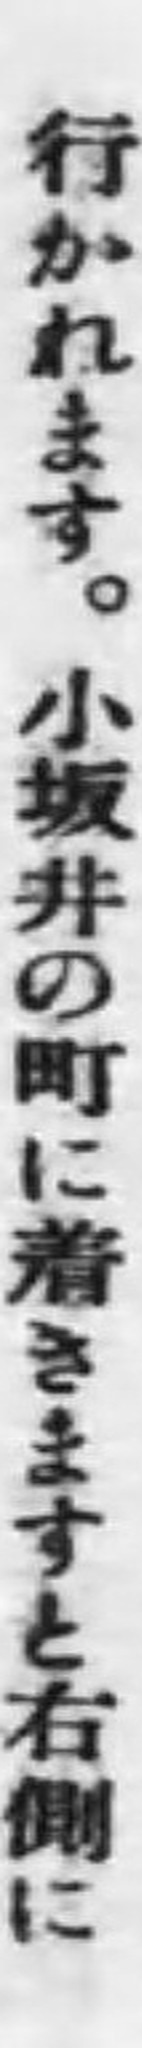行かれます。小坂井の町に着きますと右側に
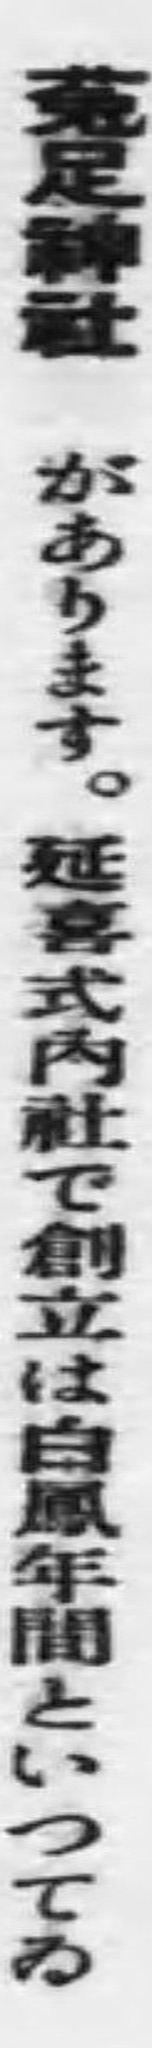菟足神社があります。延喜式内社で創立は白鳳年間といつてゐ
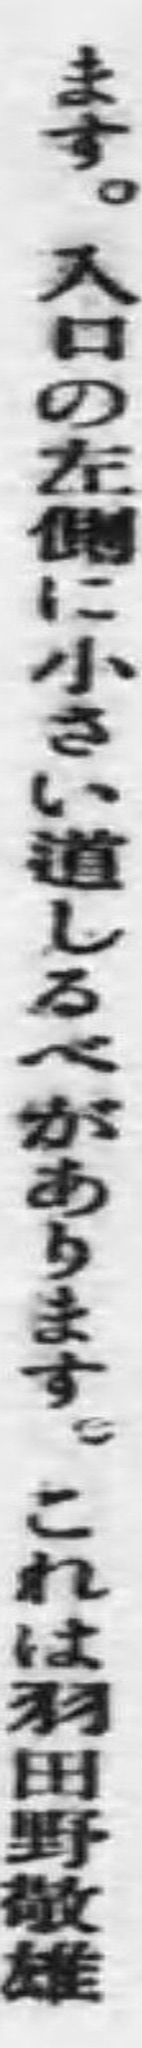ます。入口の左側に小さい道しるべがあります。これは羽田野敬雄
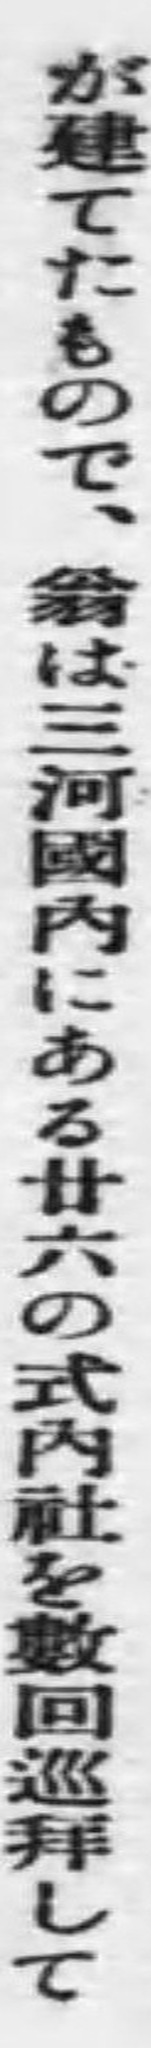が建てたもので、翁は三河国内にある廿六の式内社を数回巡拝して
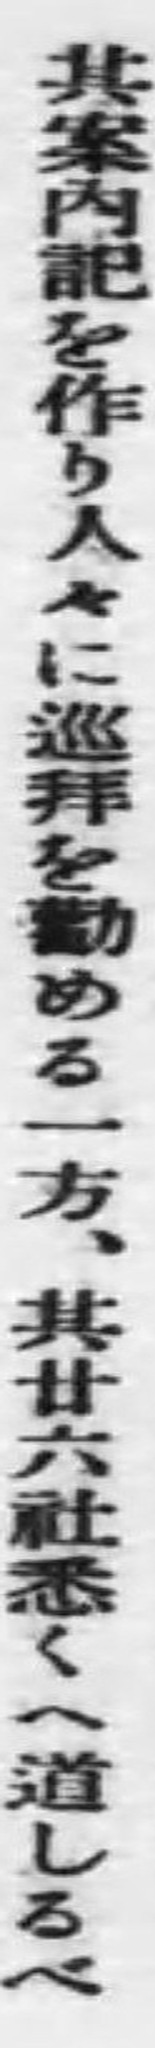其案内記を作り人々に巡拝を勧める一方、其廿六社悉くへ道しるべ
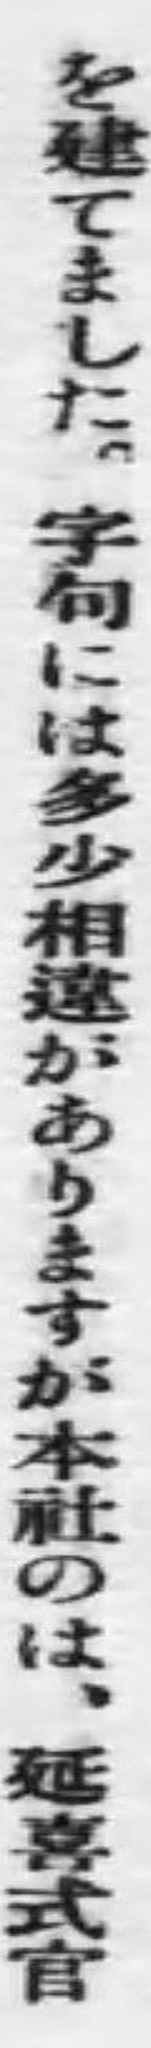を建てました。字句には多少相違がありますが本社のは、延喜式官
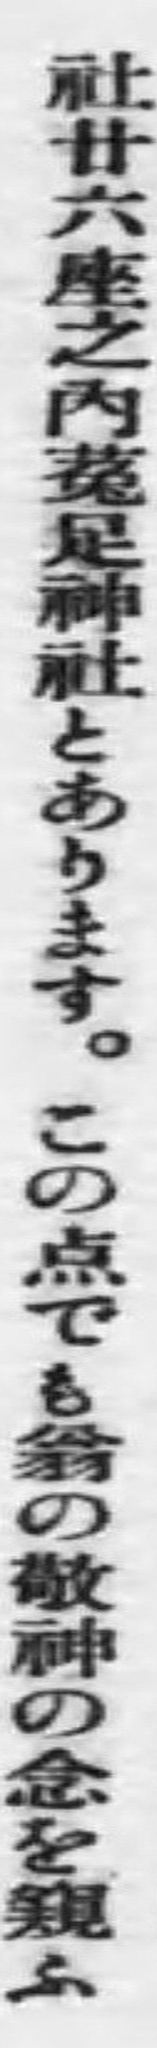社廿六座之内菟足神社とあります。この点でも翁の敬神の念を窺ふ
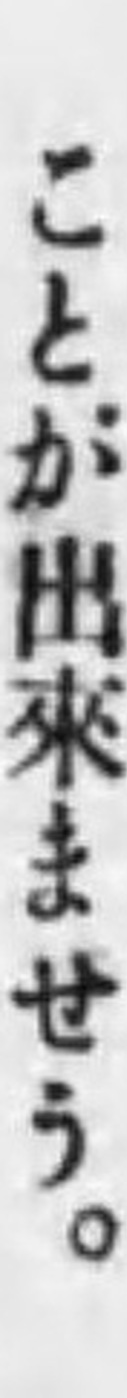ことが出来ませう。
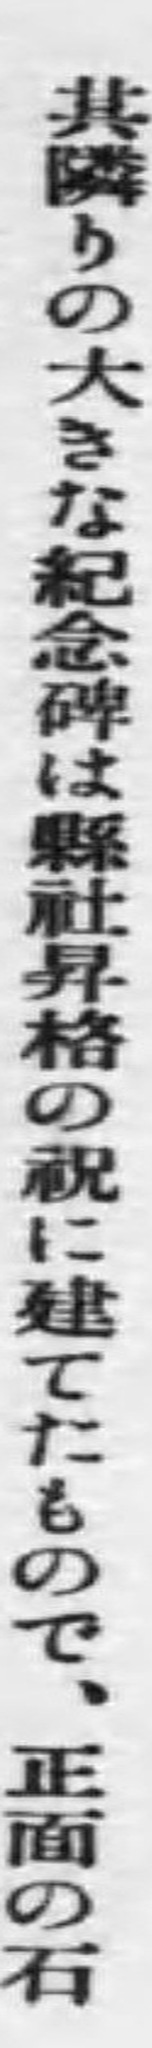其隣りの大きな紀念碑は県社昇格の祝に建てたもので、正面の石
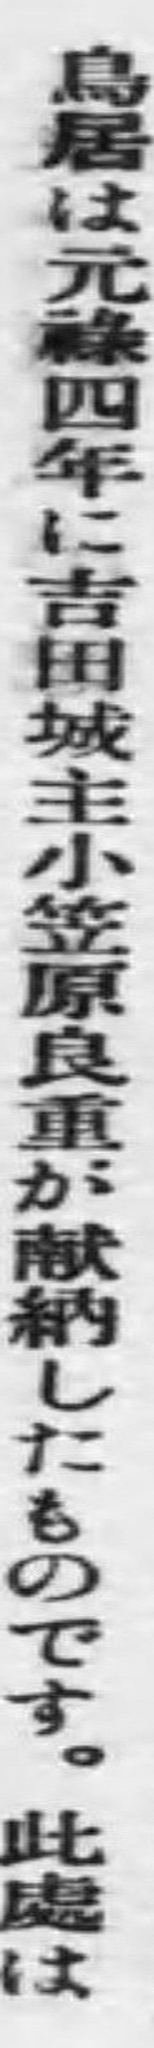鳥居は元禄四年に吉田城主小笠原良重が献納したものです。此処は
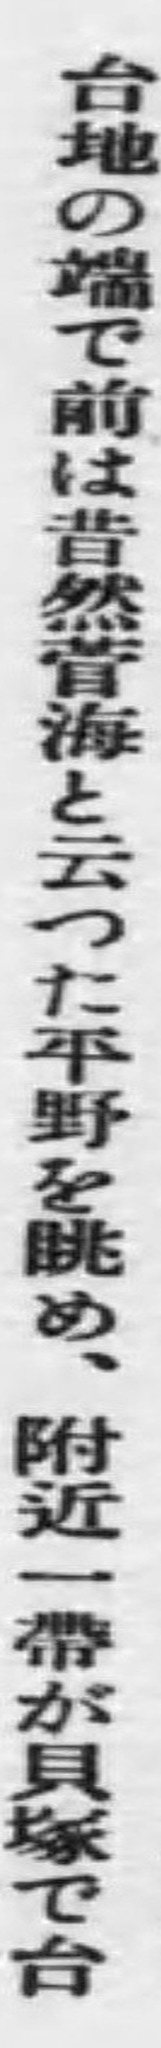台地の端で前は昔然菅海と云つた平野を眺め、附近一帯が貝塚で台
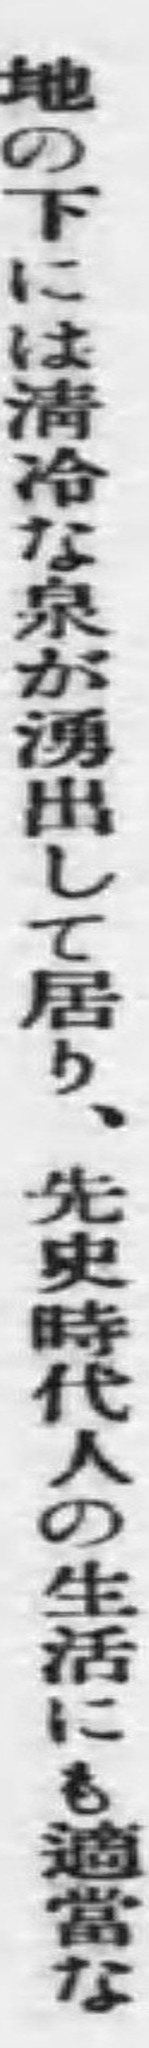地の下には清冷な泉が湧出して居り、先史時代人の生活にも適当な
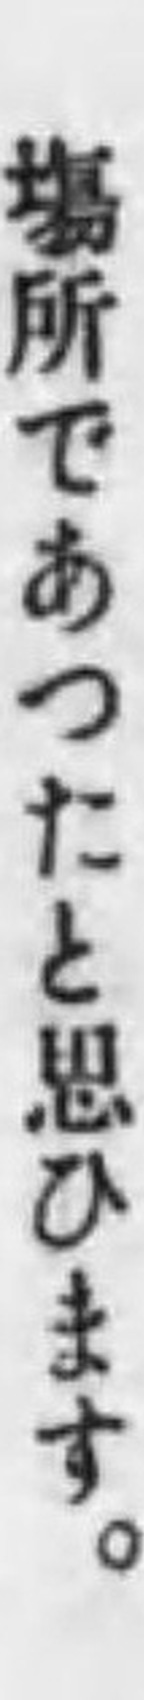場所であつたと思ひます。
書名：東三河道中記 : 豊橋市及其附近案内
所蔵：国立国会図書館 National Diet Library, JAPAN
